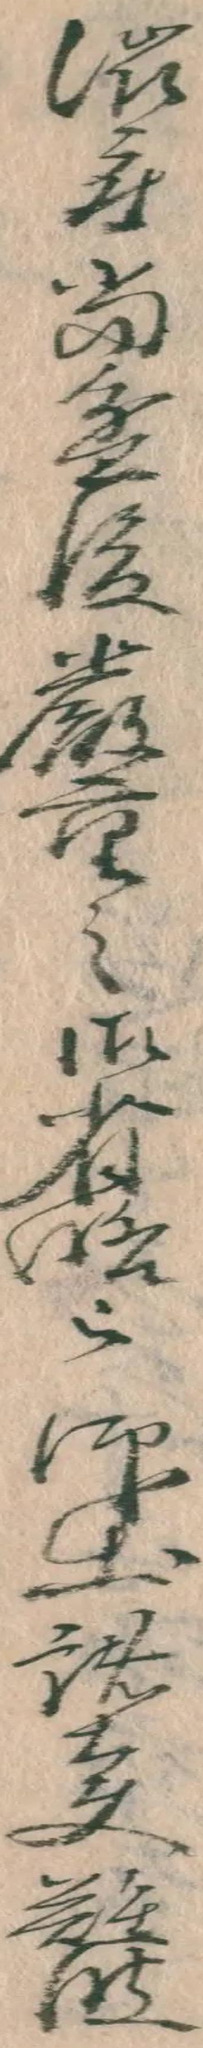渋ニ付當盆後厳重之御省略被仰出諸大夫難波
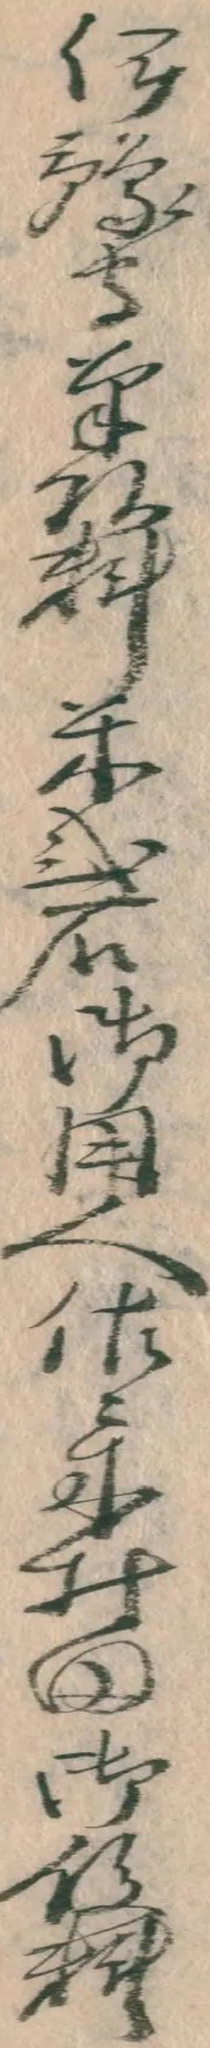伊豫守奉頭科米弐石御用人佐々木村田御役料
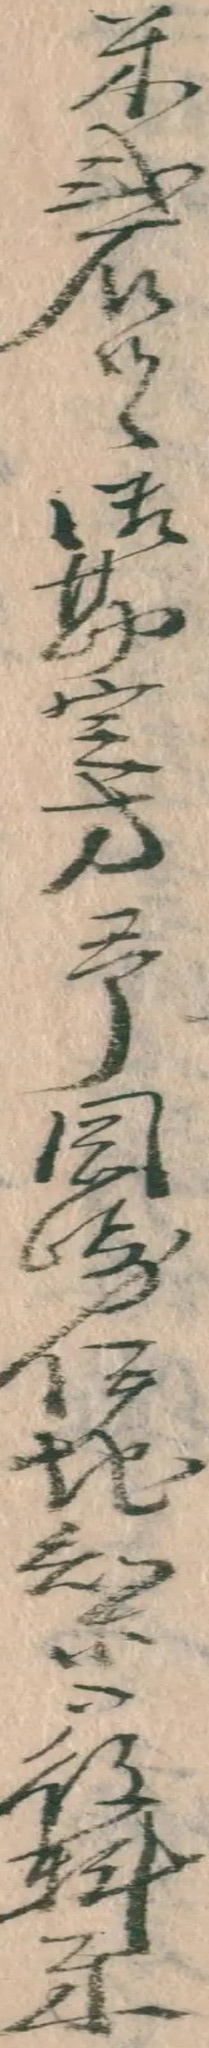米弐石ツヽ御勘定方予岡崎伊地知等御救料米
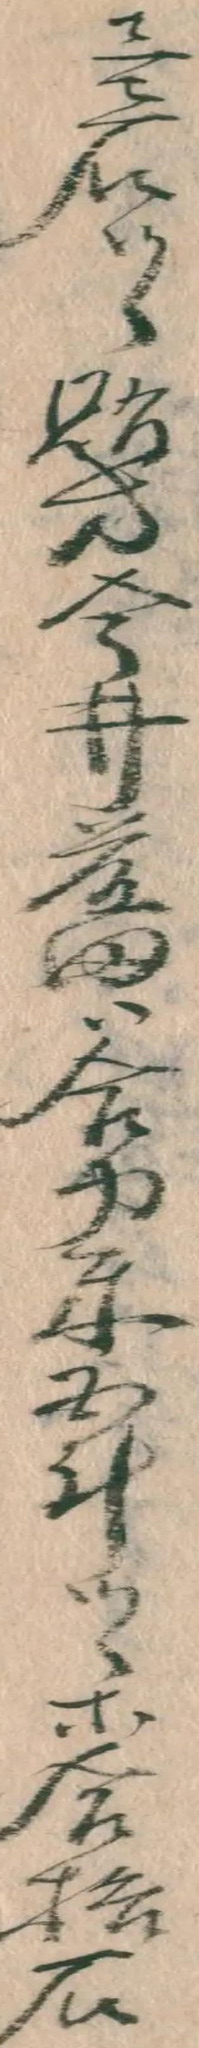壱石ツヽ賄方今井藤田御合力米五斗ツヽ等合拾石
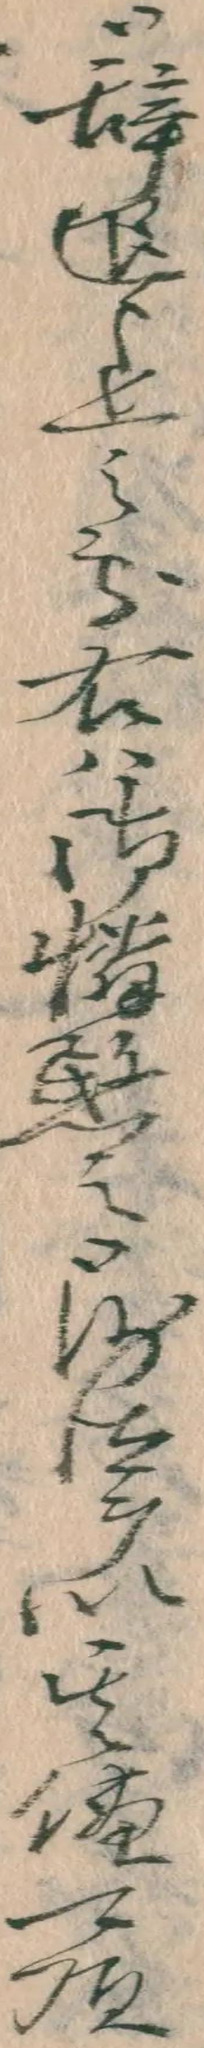御辞退申上之處右ハ御憐愍之御沙汰ヲ以其侭可頂
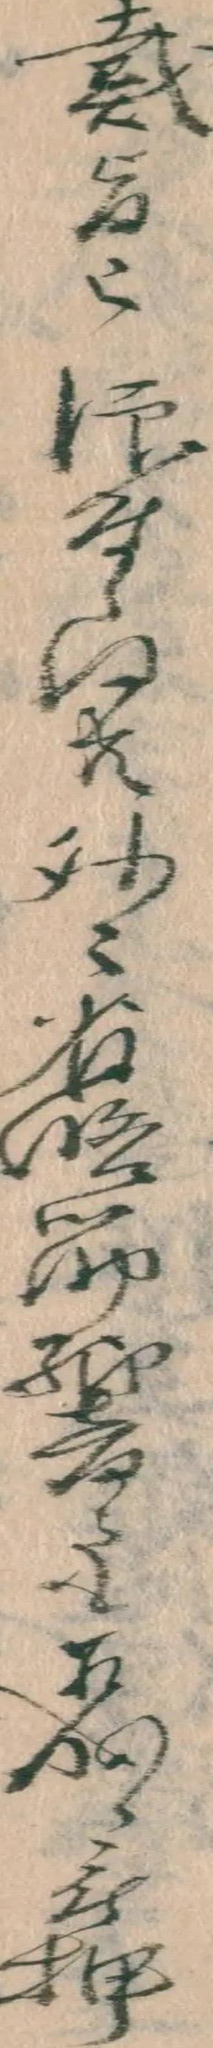裁旨被仰付候得共外々省略筋響にも相成候ニ付押
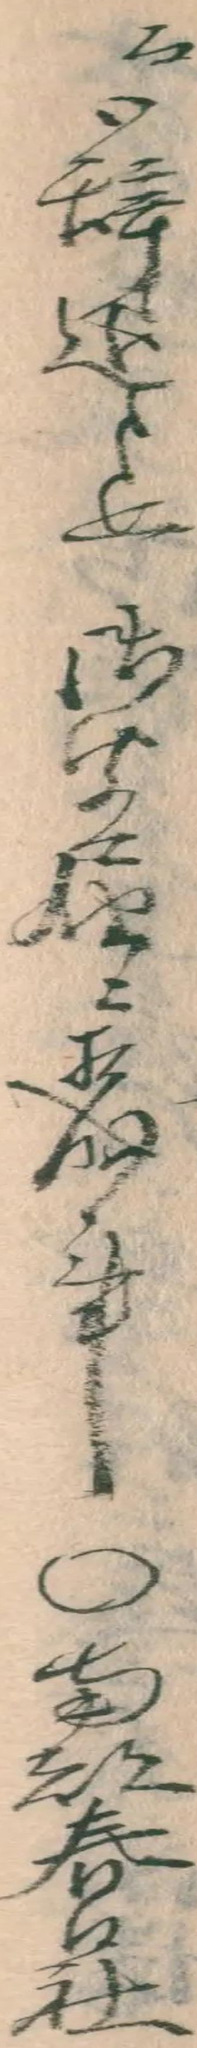而御辞退之上御聞届ニ相成候事○南都春日社
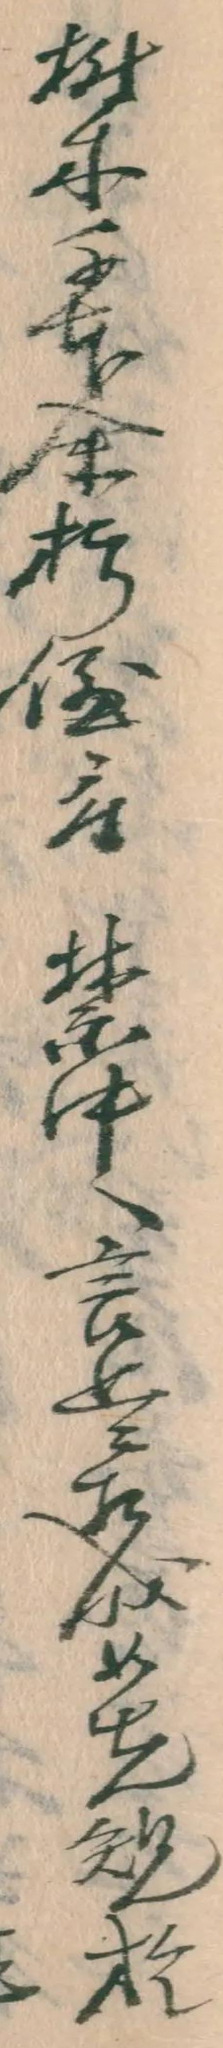樹木千本余折倒ニ付禁中へ言上ニ相成如先規於
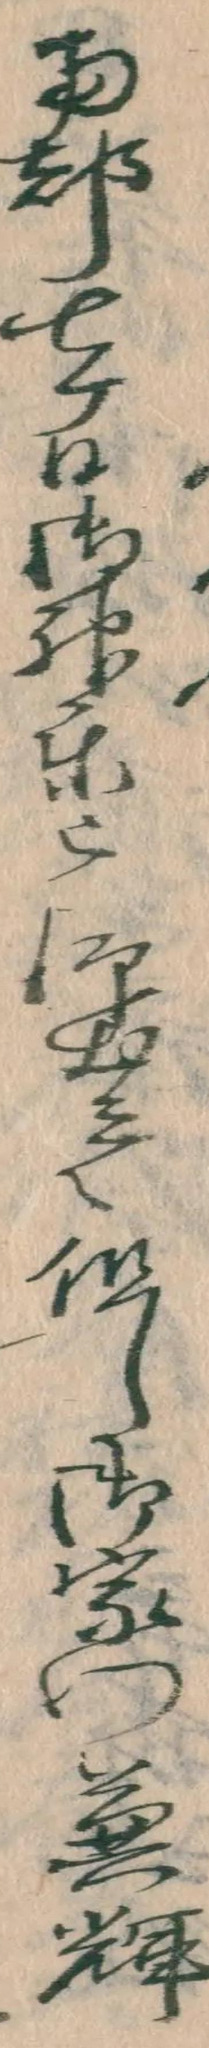南都七ヶ日御神楽被仰出云々但し御家門兼輝
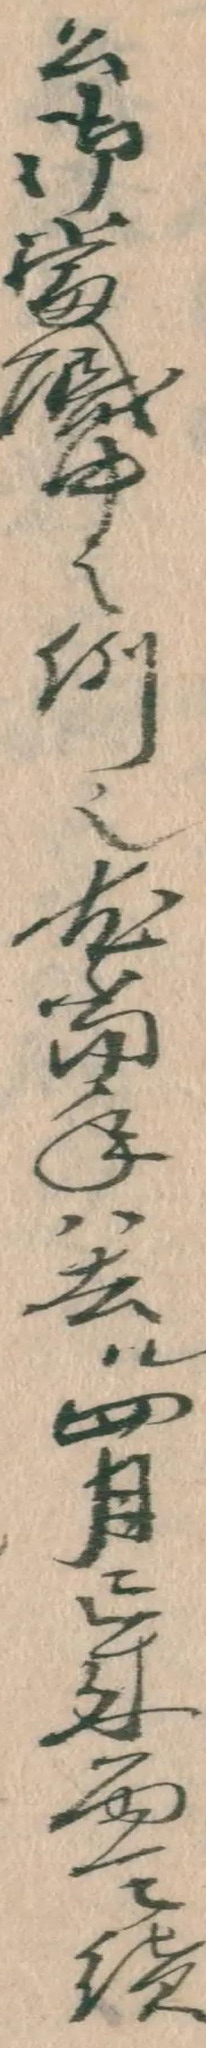公御當職中之例也尤當年ハ去ル四月已来雨天續
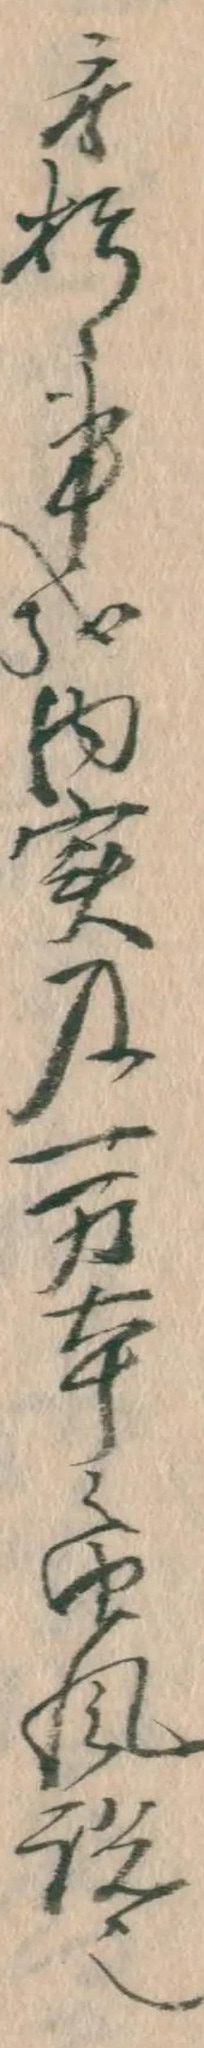二付朽事成内実及一万本之由風説也
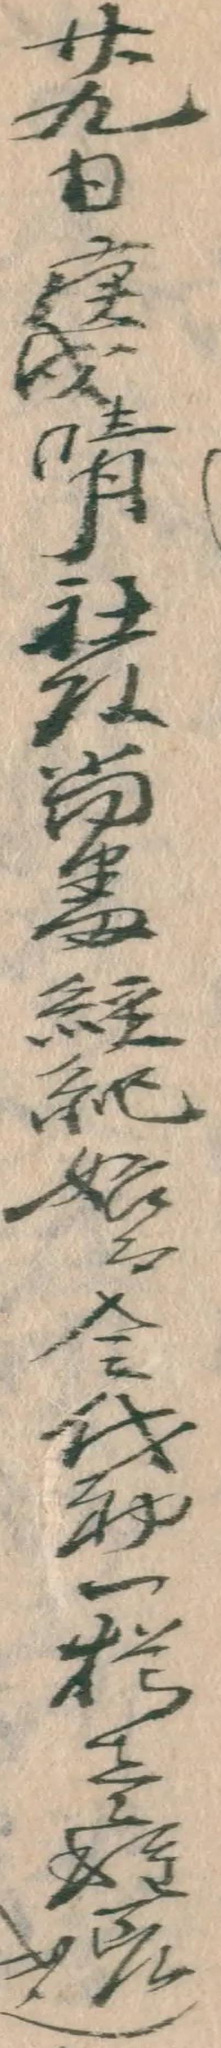廿九日庚戌晴社頭當番経紀始而令代初一樽壱種差出ス
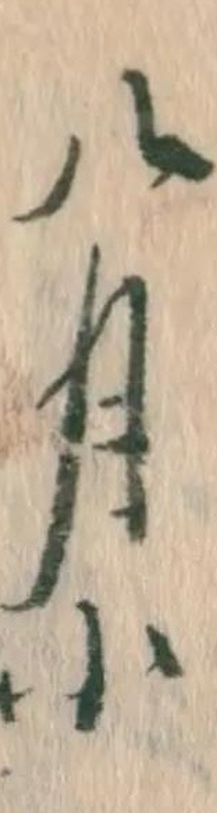八月小
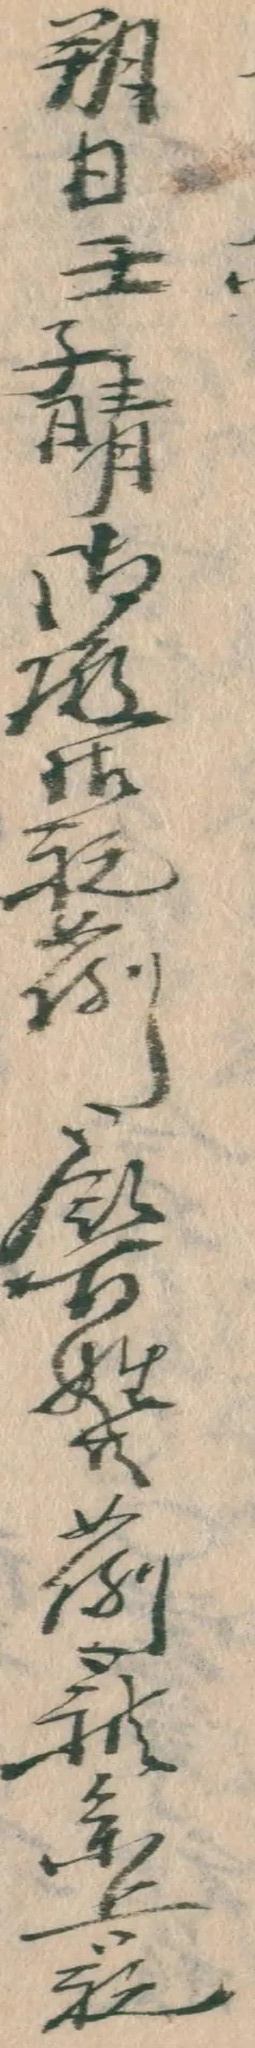朔日壬子晴御殿御祝如例了御領百姓共如例御禮参上御祝
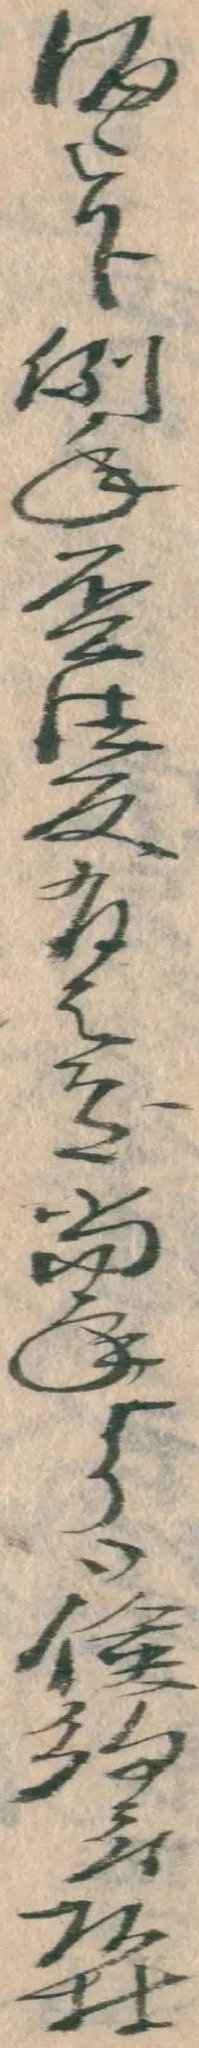酒被下例年盃法反有之處當年より御倹約ニ付頭村
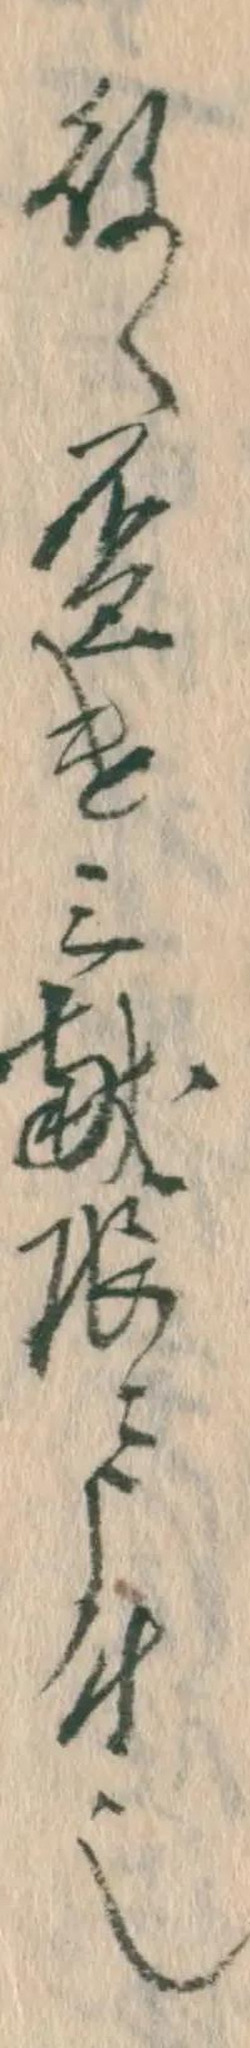役へ盃遣三献限ニ申付也
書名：賀茂社記録. 第67冊
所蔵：国立国会図書館 National Diet Library, JAPAN
